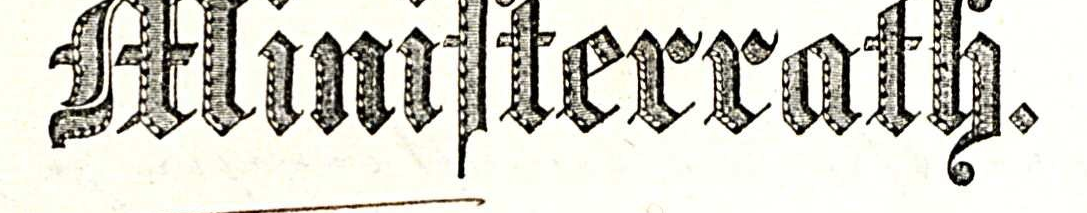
Ministerrath.
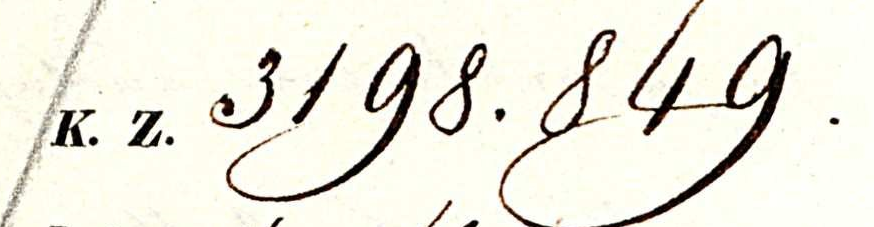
K. Z. 3198. 849.
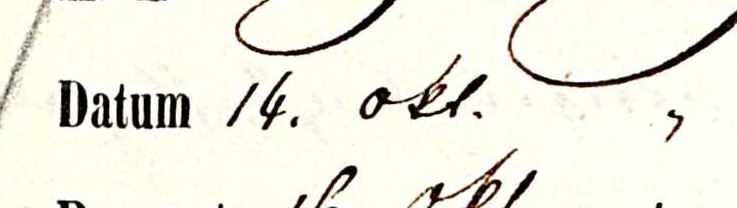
Datum 14. Okt. 849
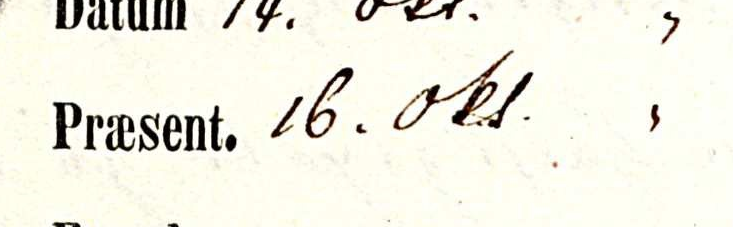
Præset. 16. Okt. 849
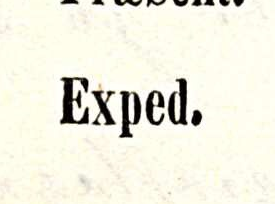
Exped.
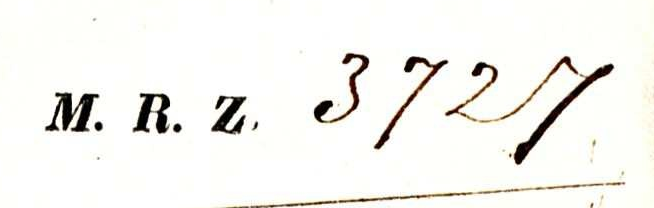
M. R. Z. 3727
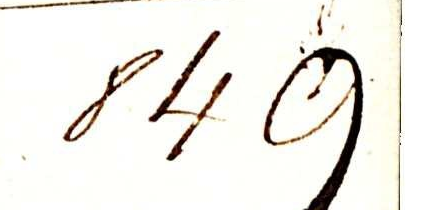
849
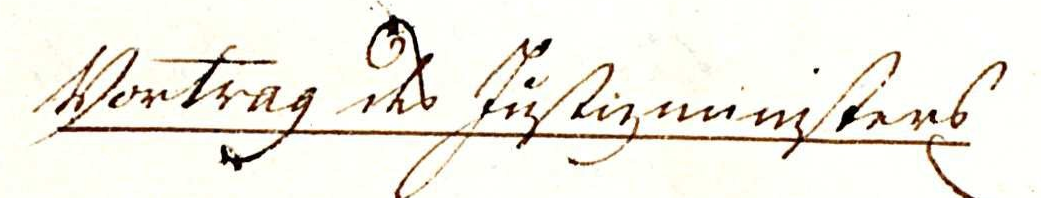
Vortrag des Justizmeisters
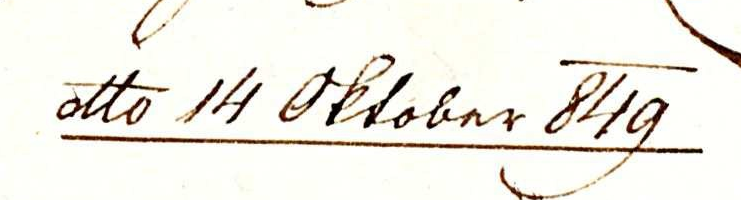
dto 14 Oktober 849
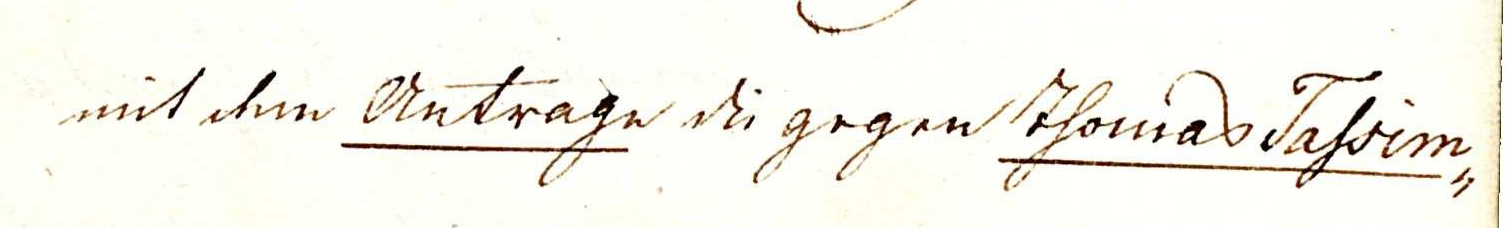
mit den Antrage die gegen Thomas Tassim¬
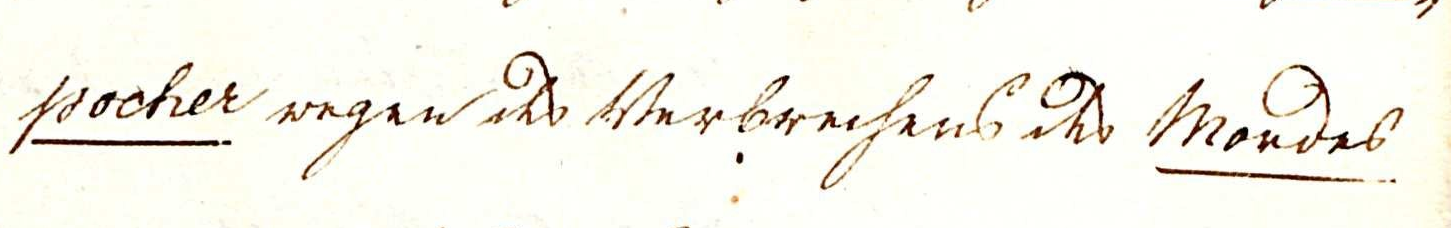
pocher wegen des Verbrechens des Mordes
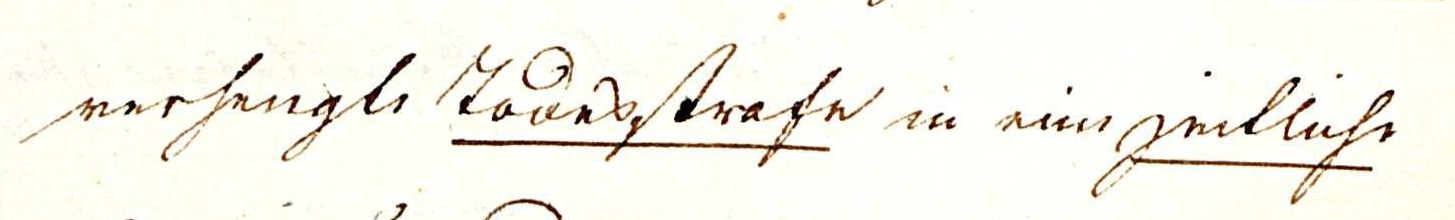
verhengte Todesstrafe in eine zeitliche
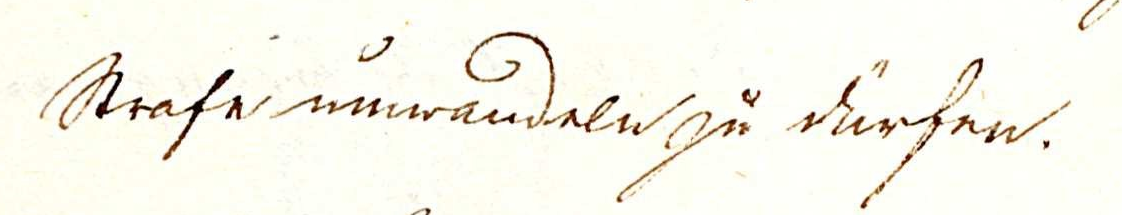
Strafe umwandeln zu dürfen.
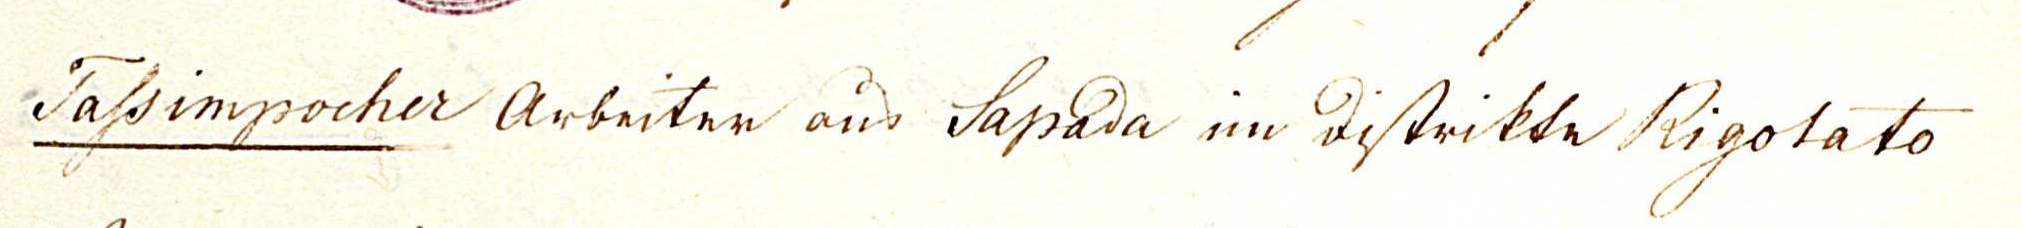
Tassimpocher Arbeiter aus Sapada im Distrikte Rigolato
